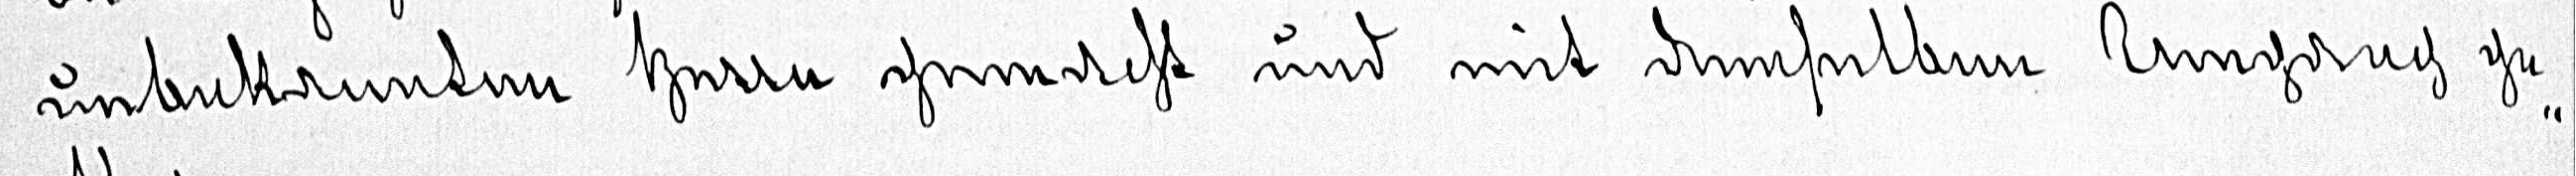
unbekannten Herrn gemacht und mit demselben Umgang ge¬
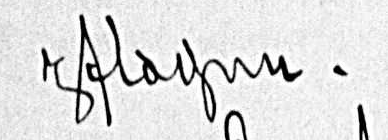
pfolgen.
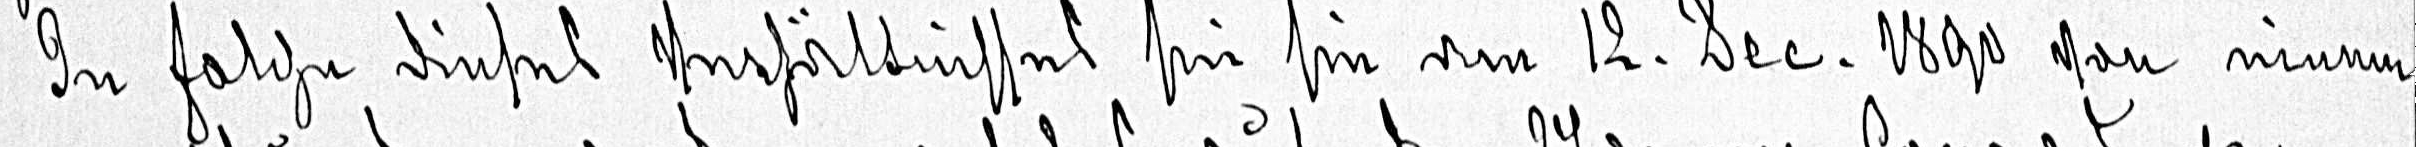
In Folge dieses Verhältnisses sei sie am 12. Dec 1890 von einem
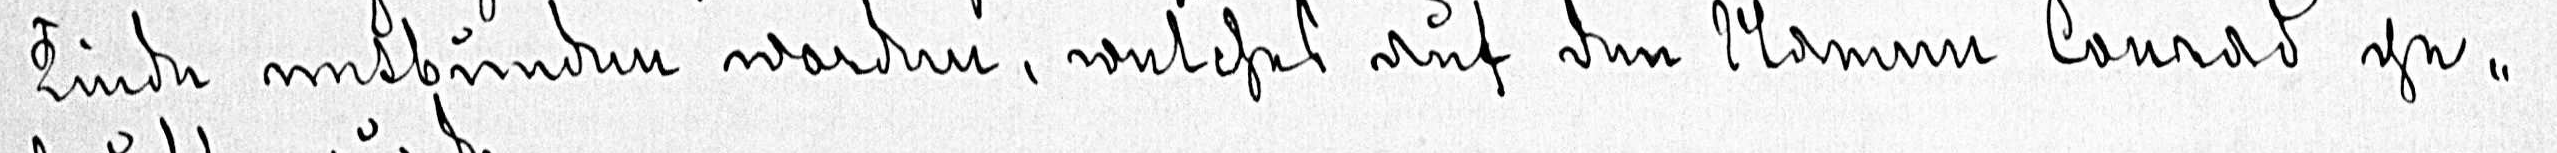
Kinde entbunden worden, welches auf den Namen Conrad ge¬
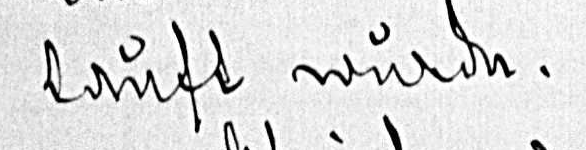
tauft wurde.
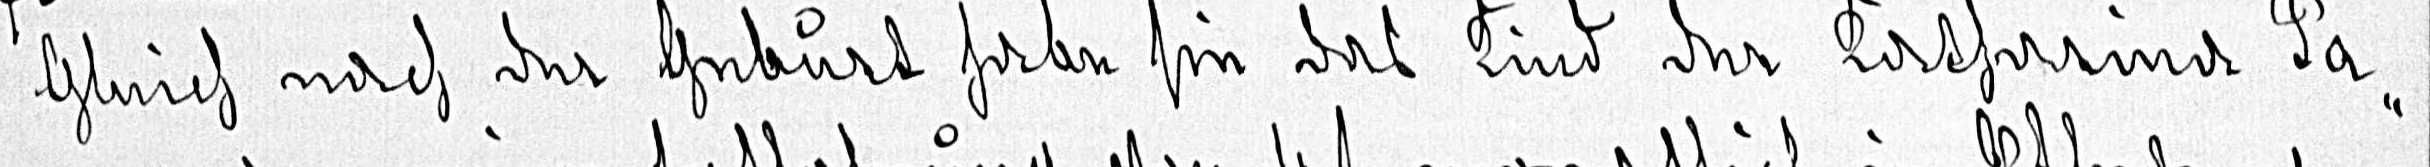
Gleich nach der Geburt habe sie das Kind der Katharina Pa¬
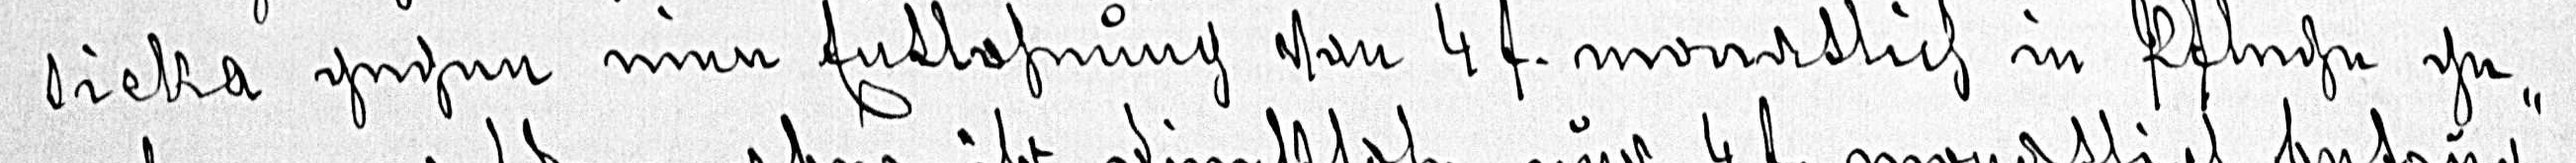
sieka gegen eine Entlohnung von 4f monatlich in Pflege ge¬
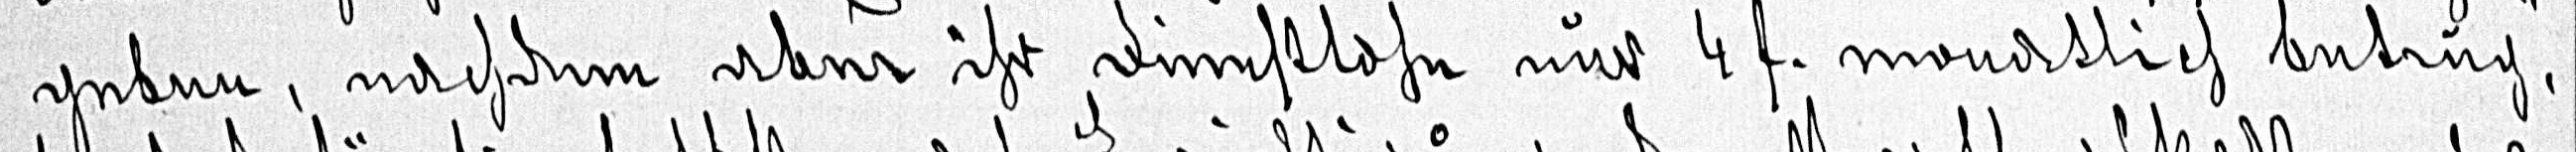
geben nachdem aber ihr Dienstlohn nur 4f monatlich betrug,
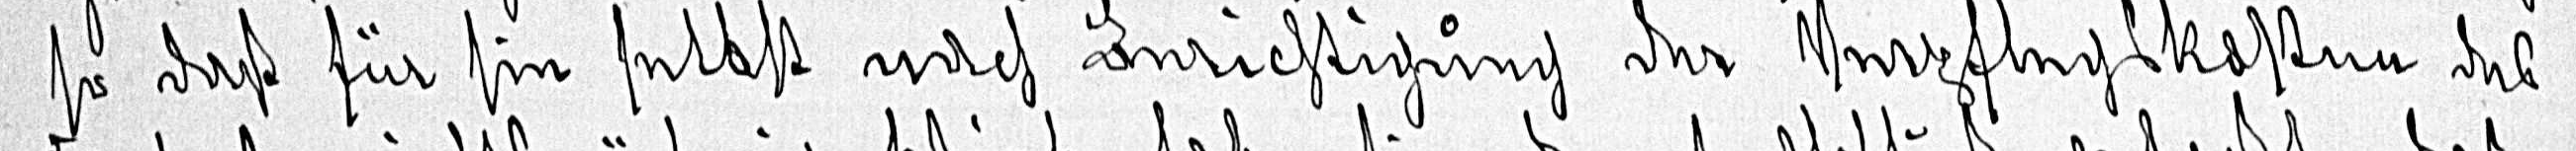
so daß für sie selbst nach Berichtigung der Verpflegskosten des
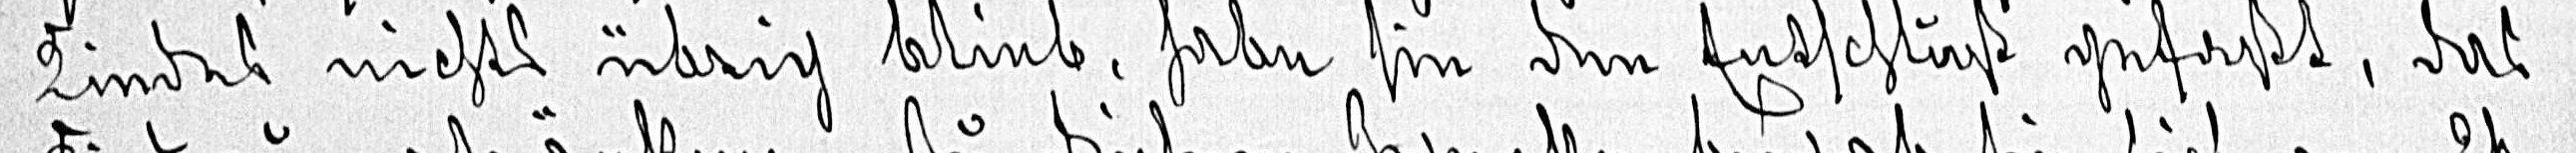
Kindes nichts übrig blieb, habe sie den Entschluß gefaßt, das
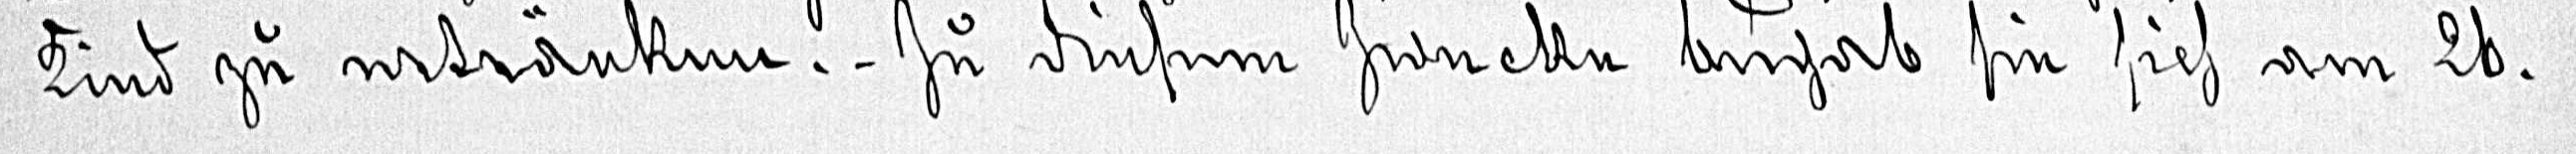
Kind zu ertränken. Zu diesem Zwecke begab sie sich am 26.
